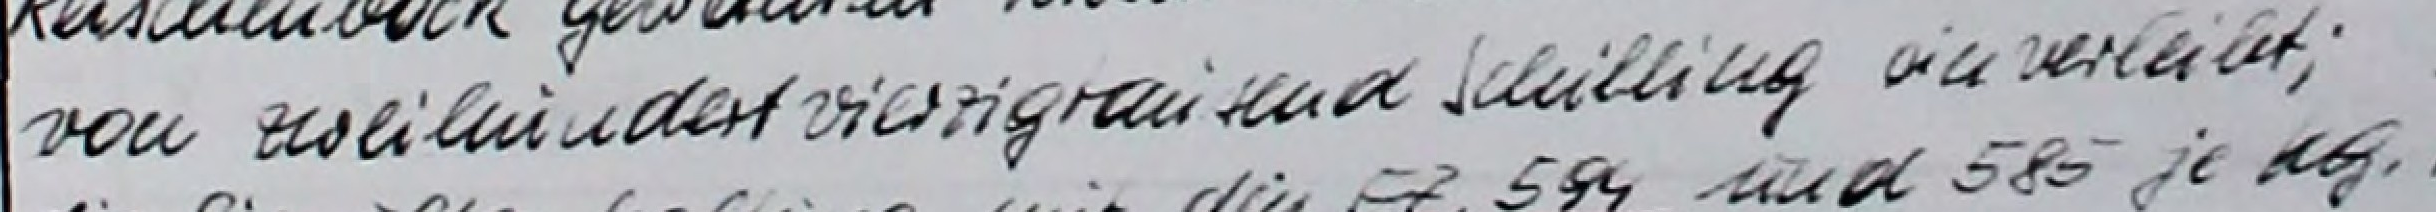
von zweihundertvierzigtausend Schilling einverleibt;
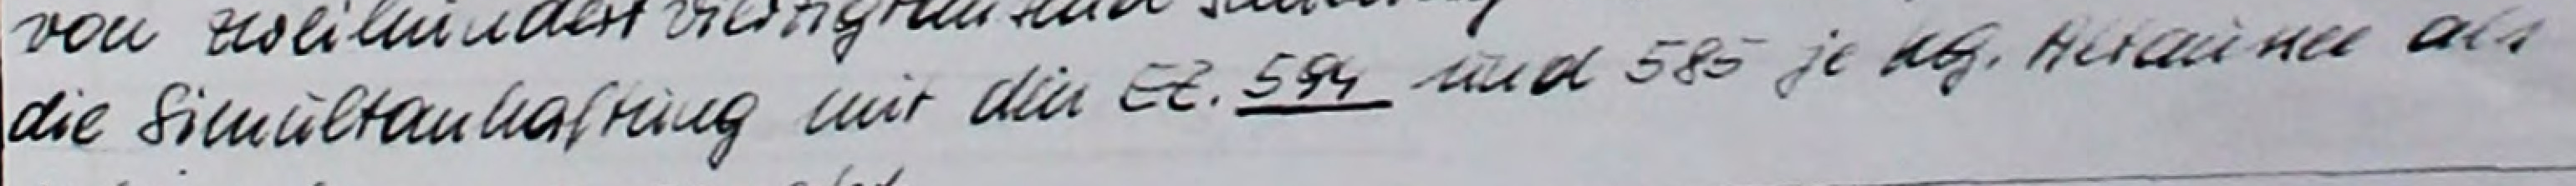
die Simultanhaftung mit den EZ. 594 und 585 je KG. Altaussee als
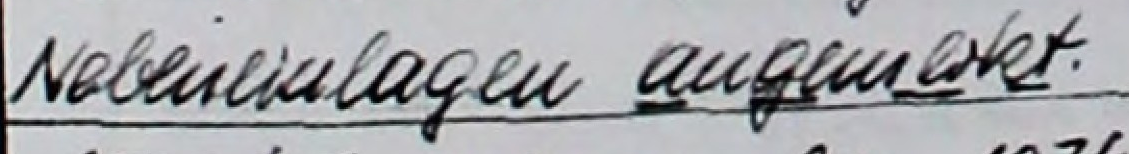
Nebeneinlagen angemerkt.
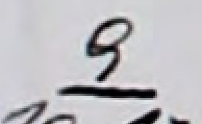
9
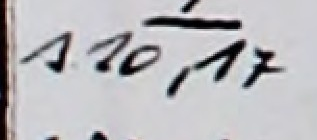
s. 10, 17
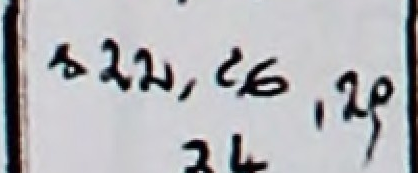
s 22, 26, 29
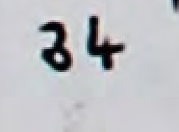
34
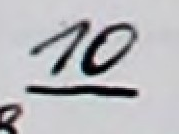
10
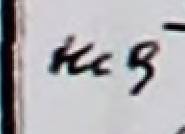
zu 9
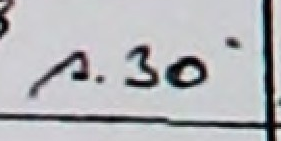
s. 30
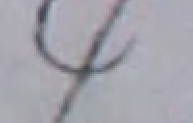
4
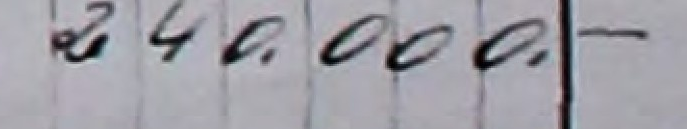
240.000.
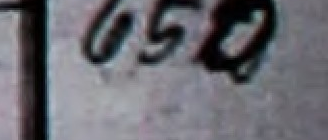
650
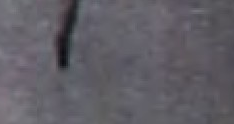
5
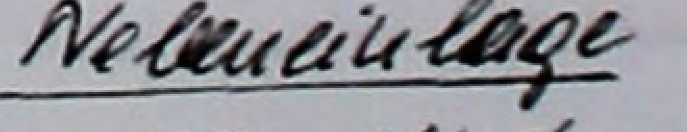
Nebeneinlage
